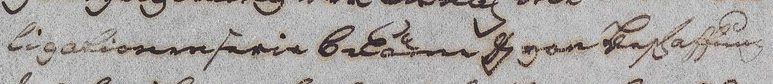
ligationenserie bekäme & von Beschaffung
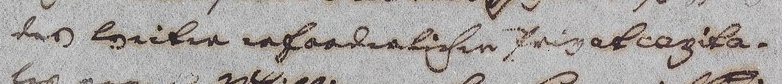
des weiter erforderlichen Privatcapita-
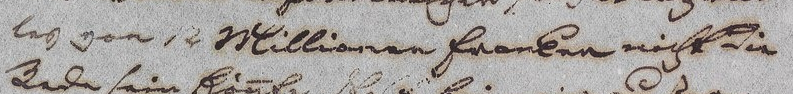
les von 12 Millionen Franken nicht die
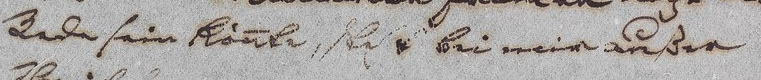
Rede sein könnte, steht bei mir außer
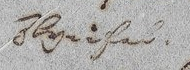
Zweifel.
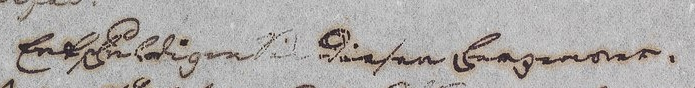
Entschuldigen Sie diesen Herzenser-
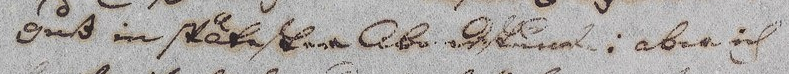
guß in spätester Abendstunde: aber ich
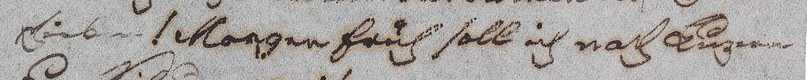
schieben! Morgen früh soll ich nach Luzern
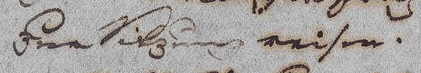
zur Sitzung reisen.
